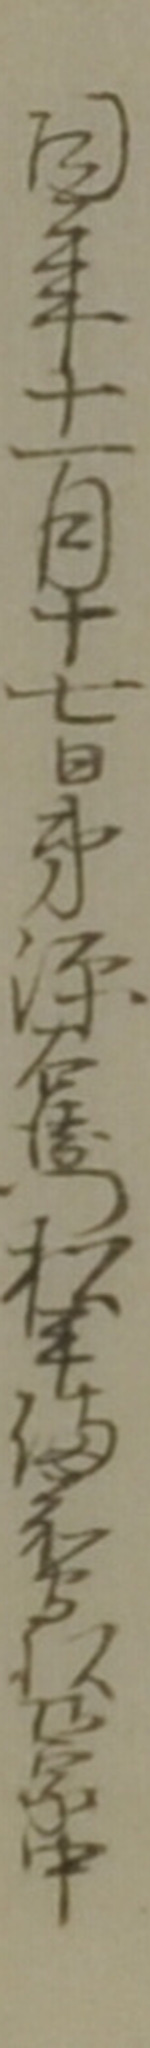一同年十一月十七日弟源右衛門松平備前守様御家中

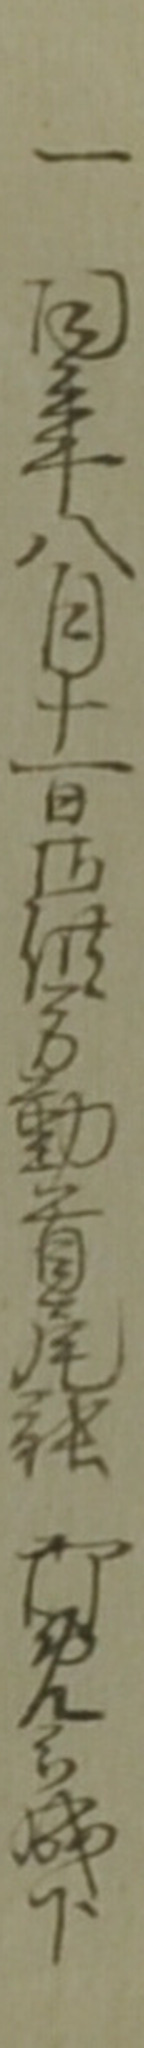一同年八月十一日御供方勤首尾張御免被成下
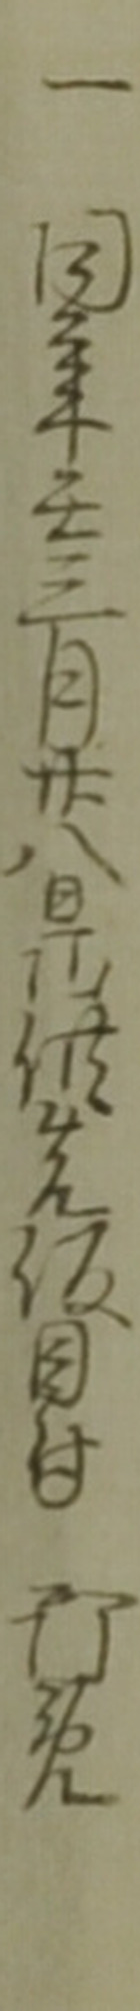一同年閏三月廿八日御供先仮目付御免
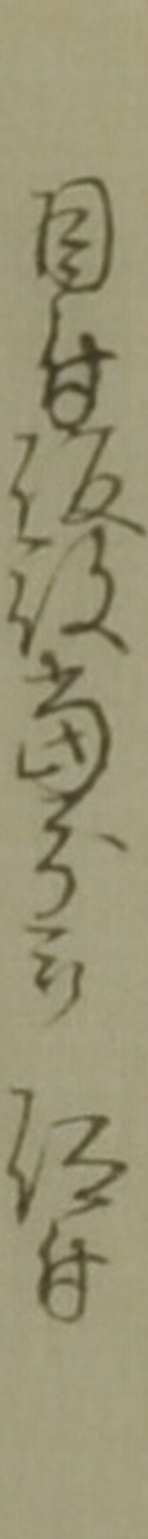目付仮役当分被仰付
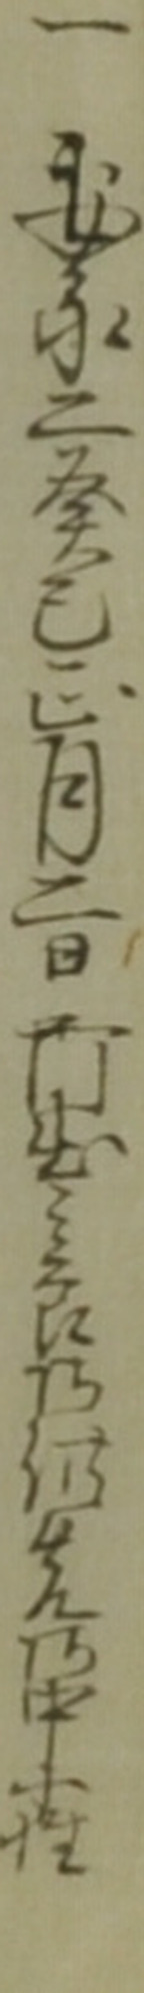一安永二癸巳正月二日御出之節御供先御中小性
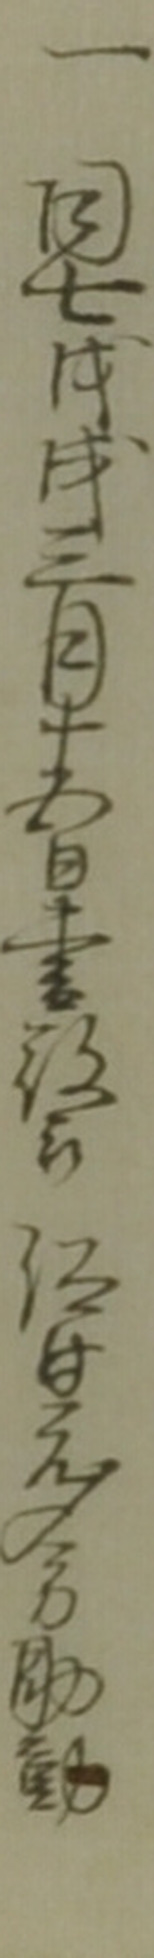一同七戊戌三月十五日書役被仰付元〆方助勤
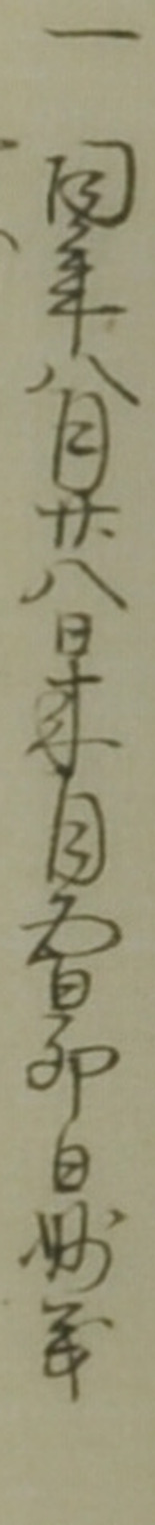一同年八月廿八日来月五日卯日妙義

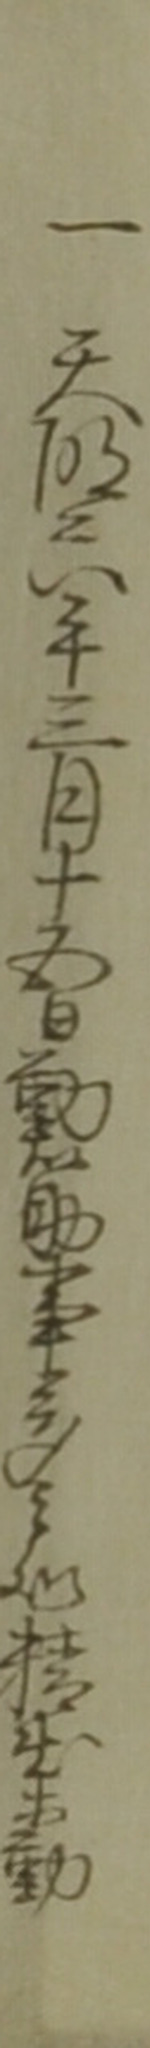一天明六午三月十五日勤筋事多之処精出相勤
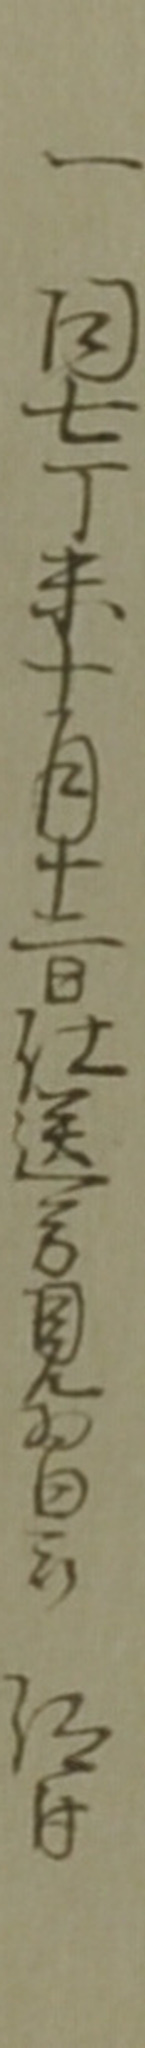一同七丁未十月十二日仕送方見習被仰付
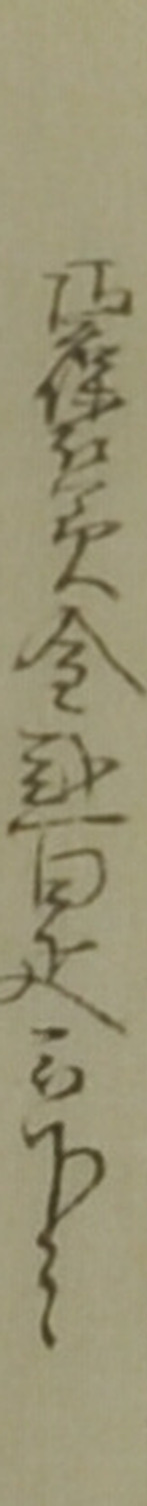御褒美金弐百疋被下之
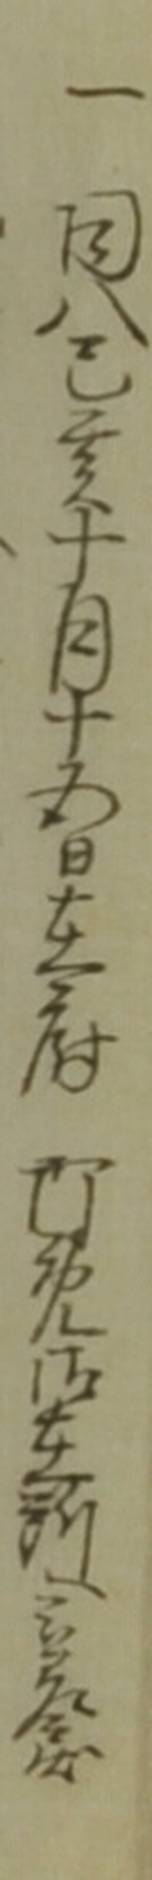一同八己亥十月十五日在府御免御在所へ被差戻
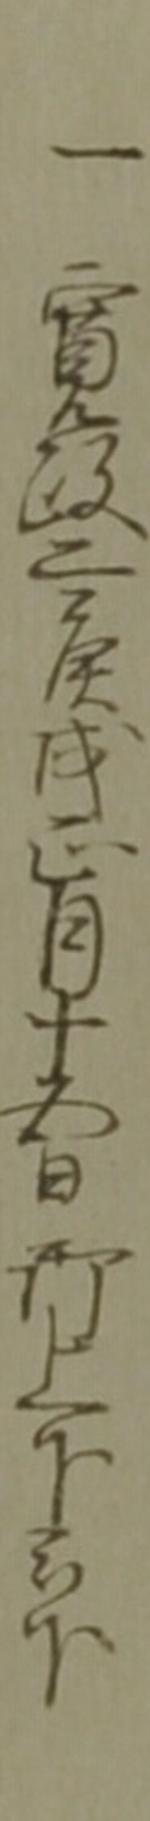一寛政二庚戌正月十五日御上下被下
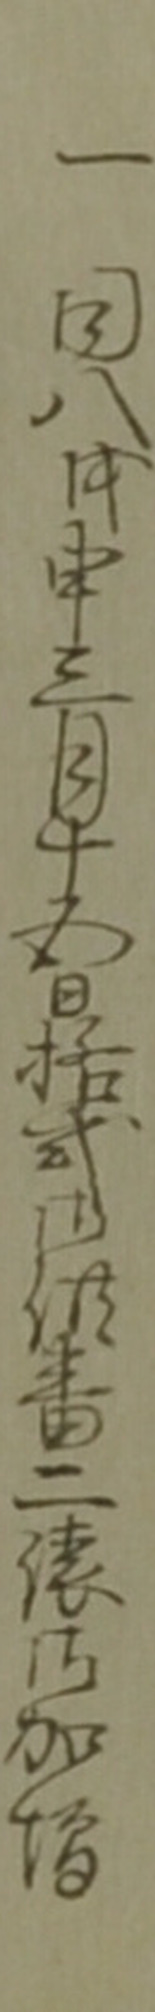一同八戊申三月十五日格式御供番二俵御加増
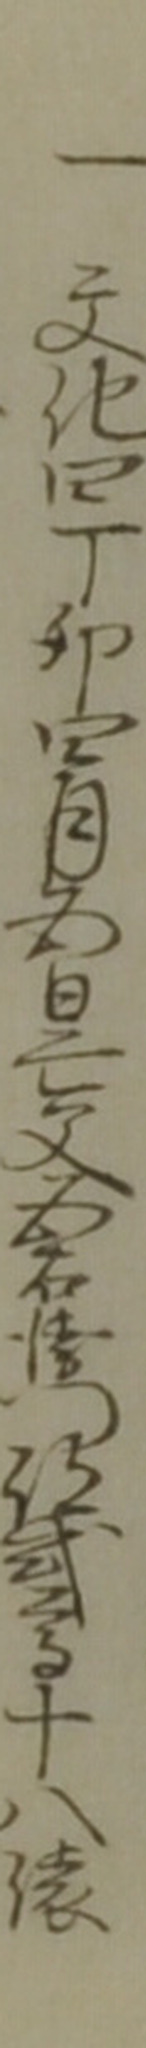一文化四丁卯四月五日亡父五右衛門跡式高十八俵
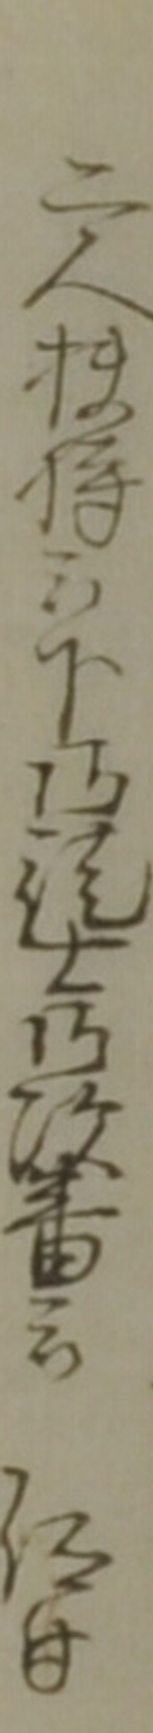二人扶持被下御徒士御次番被仰付
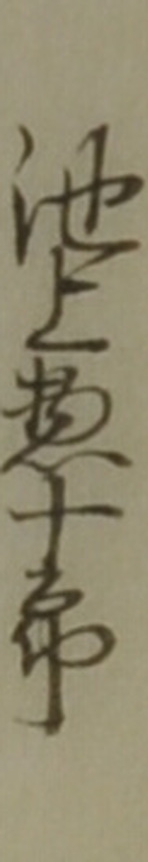池上惣十郎
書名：無足廃家（弐）
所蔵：伊那市立高遠町図書館・合同会社AMANE
